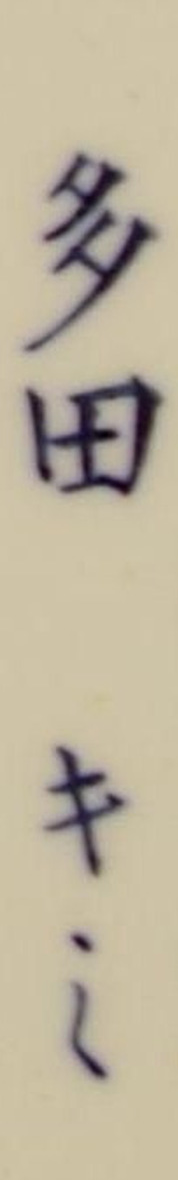多田キミ
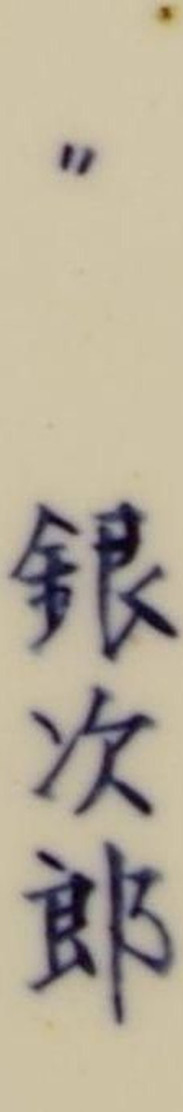銀次郎
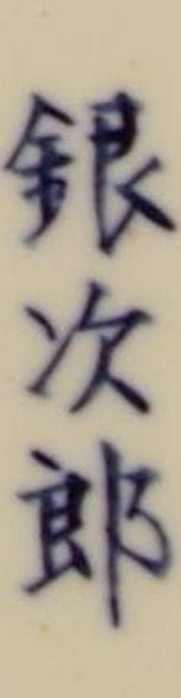銀次郎
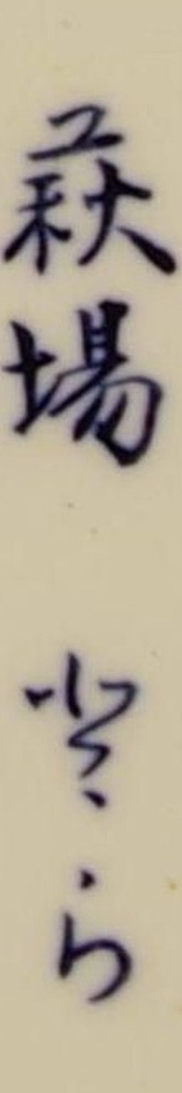萩場とら
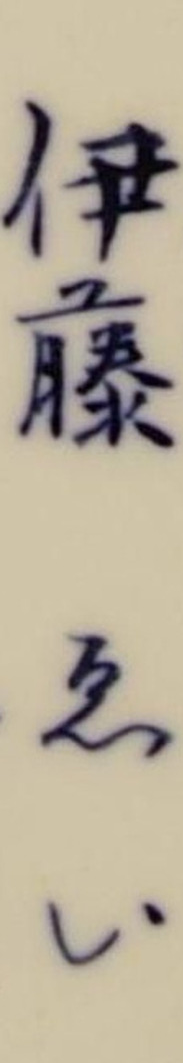伊藤えい
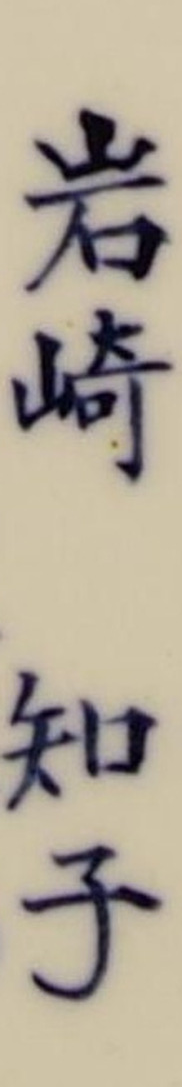岩崎知子
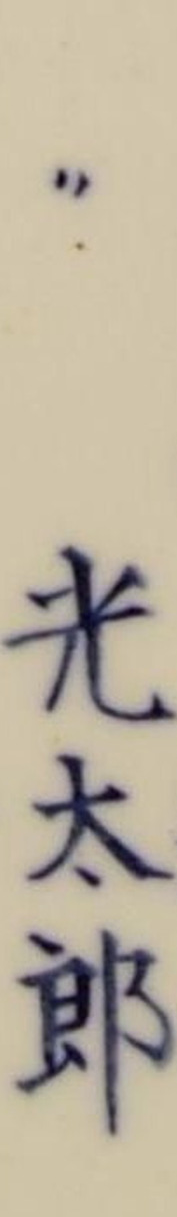光太郎
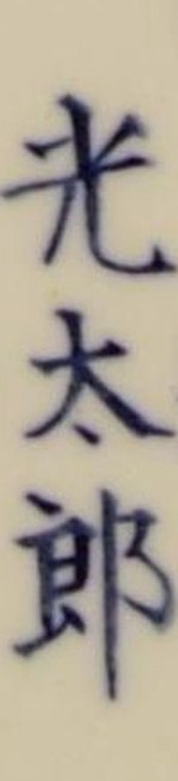光太郎
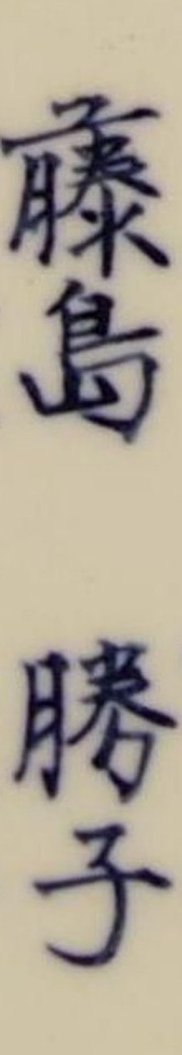藤島勝子
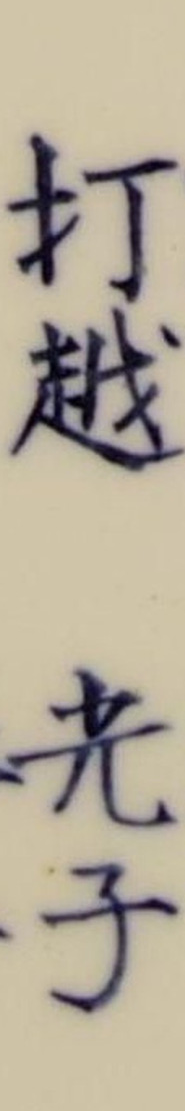打越光子
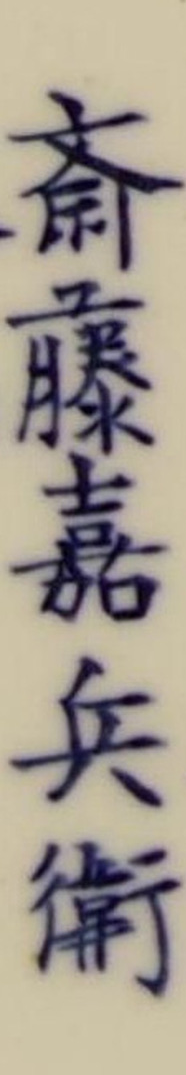斎藤嘉兵衛
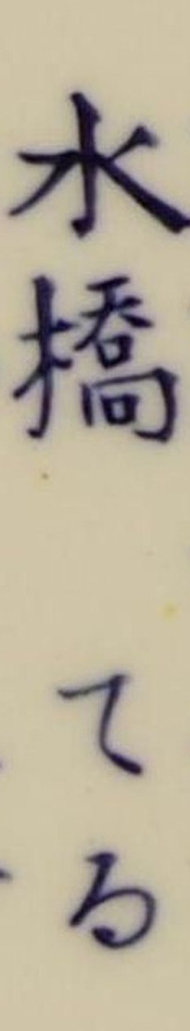水橋てる
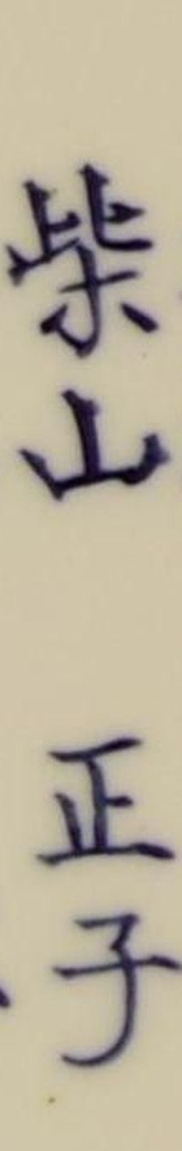柴山正子
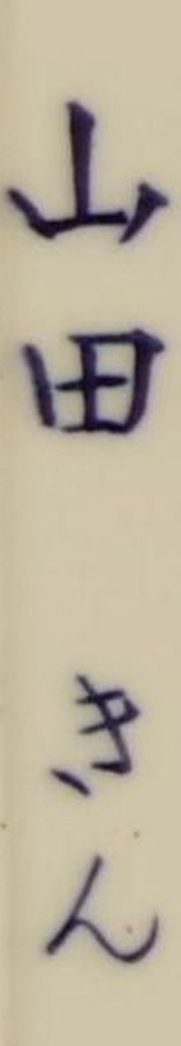山田きん

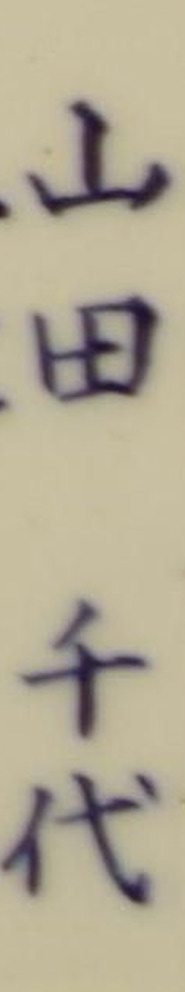山田千代
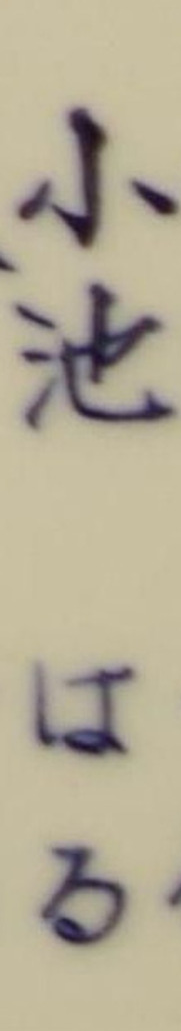小池はる
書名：E~L
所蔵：高野山金剛峯寺
